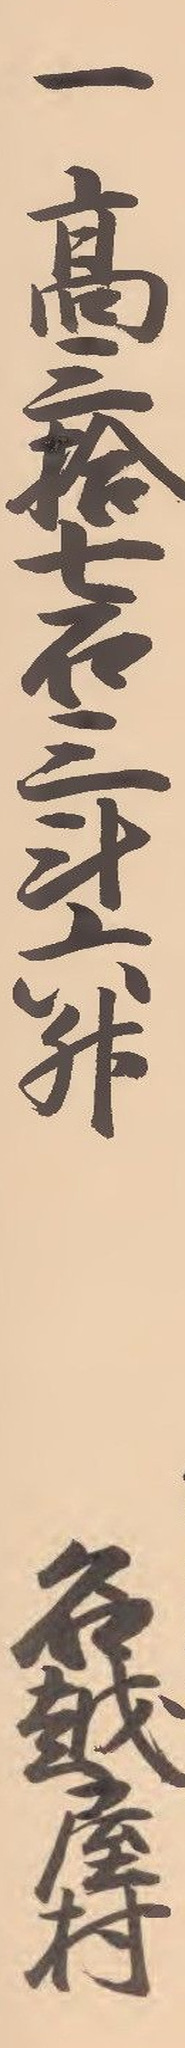一髙三拾七石三斗六升名越屋村
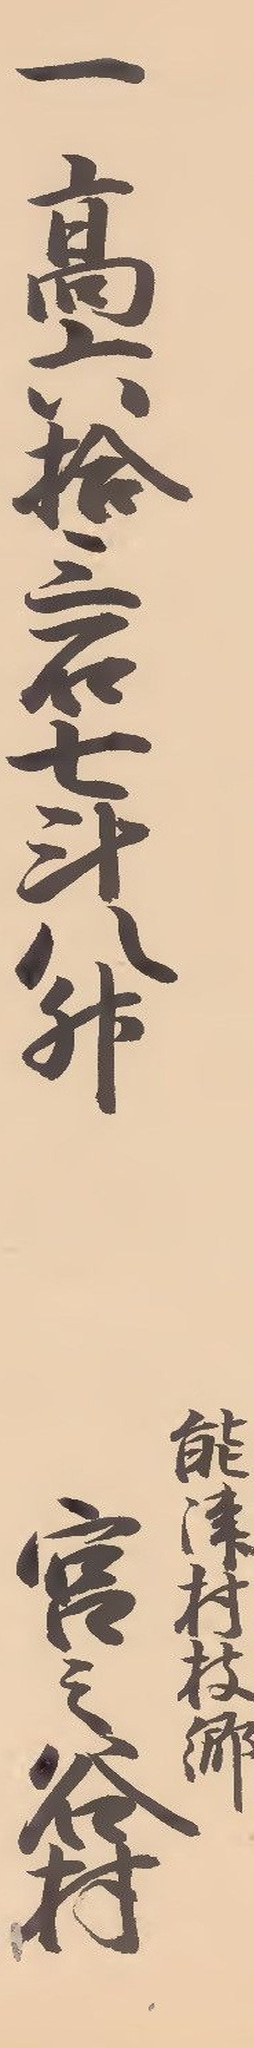一髙六拾三石七斗八升宮之谷村
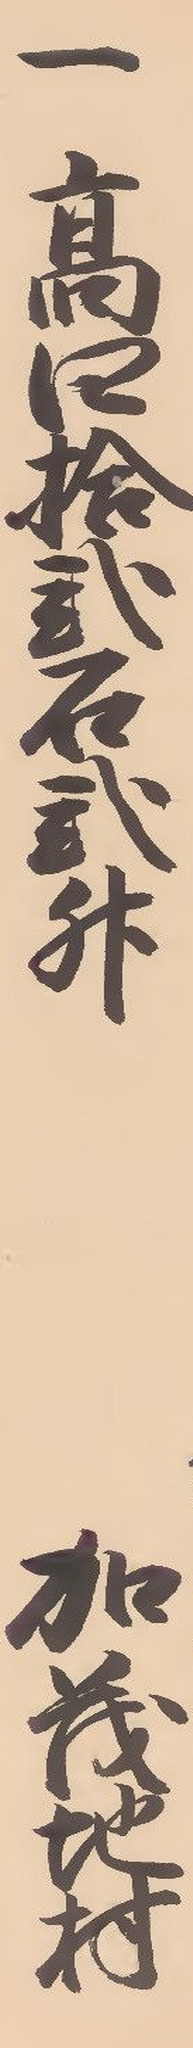一髙四拾弐石弐升加茂地村

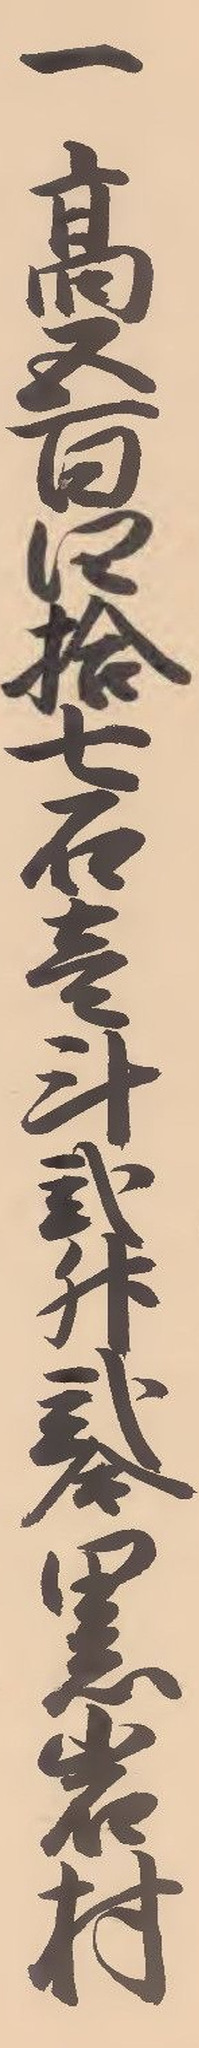一髙五百四拾七石壱斗壱升弐合黑岩村
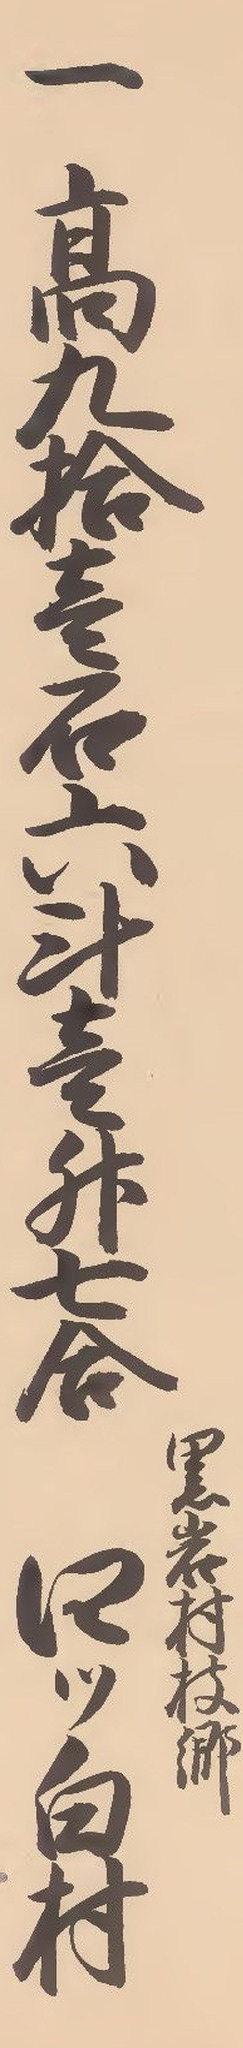一髙九拾壱石六斗壱升七合四ツ白村
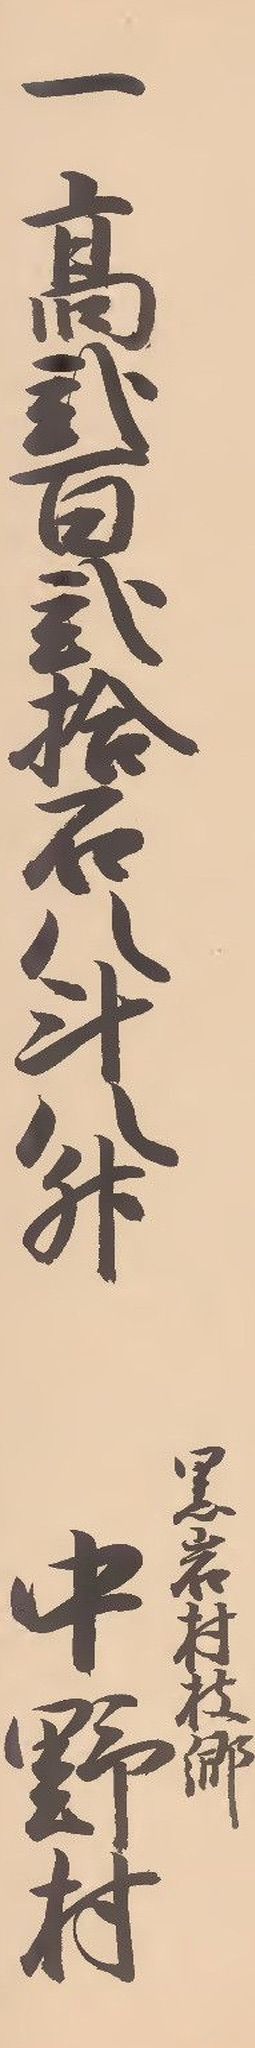一髙弐百弐拾石八斗八升中野村
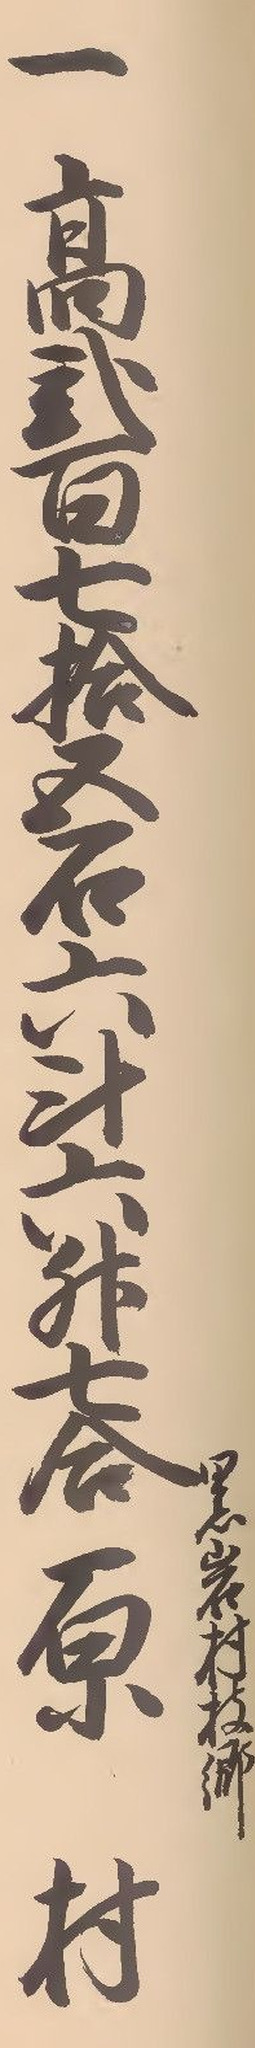一髙弐百七拾五石六斗六升七合原村
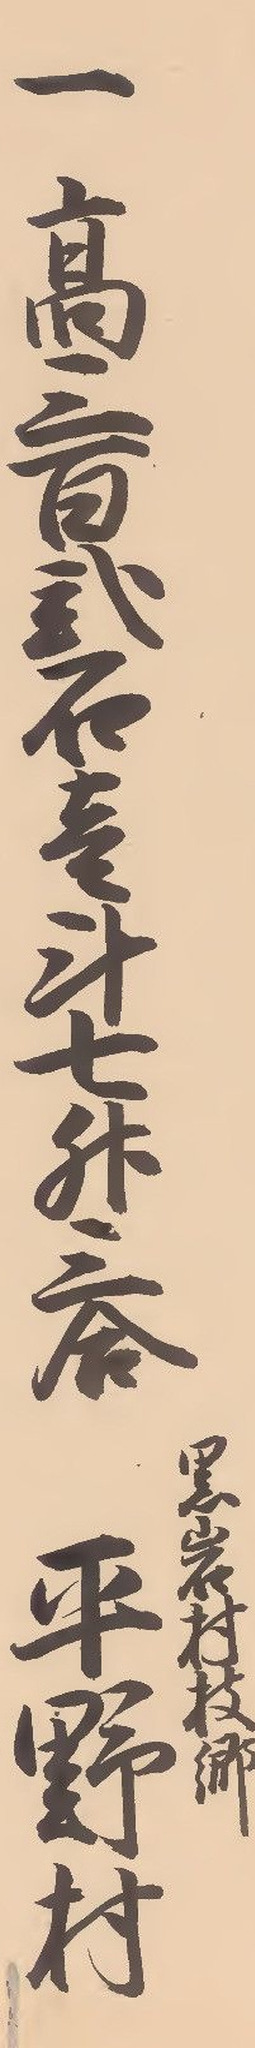一髙三百弐石壱斗七升三合平野村
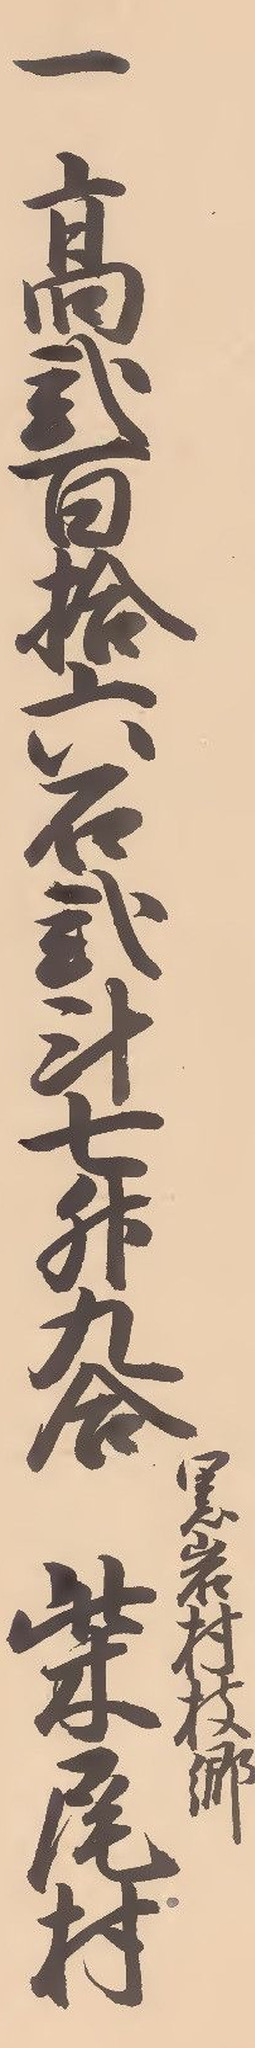一髙弐百拾六石弐斗七升九合柴尾村
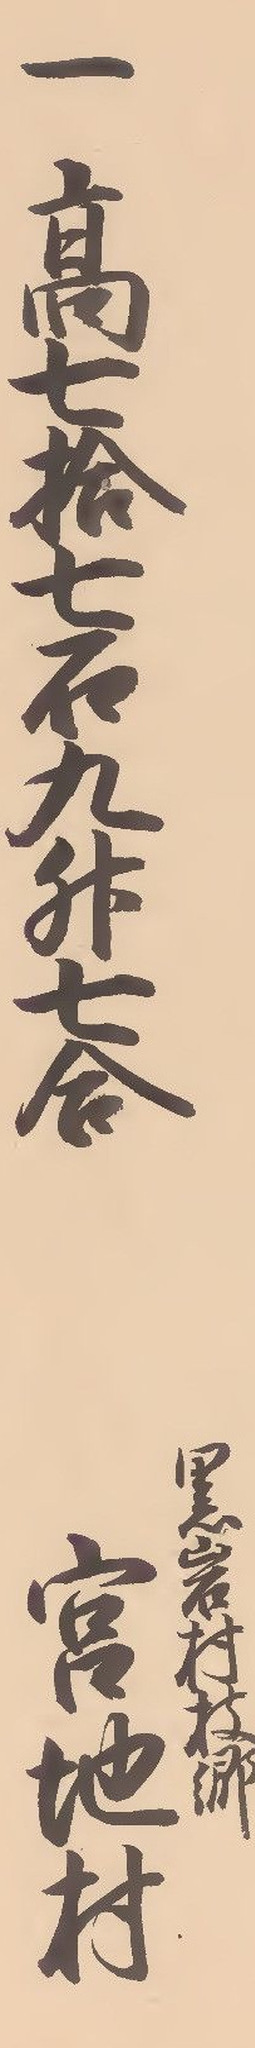一髙七拾七石九升七合宮地村

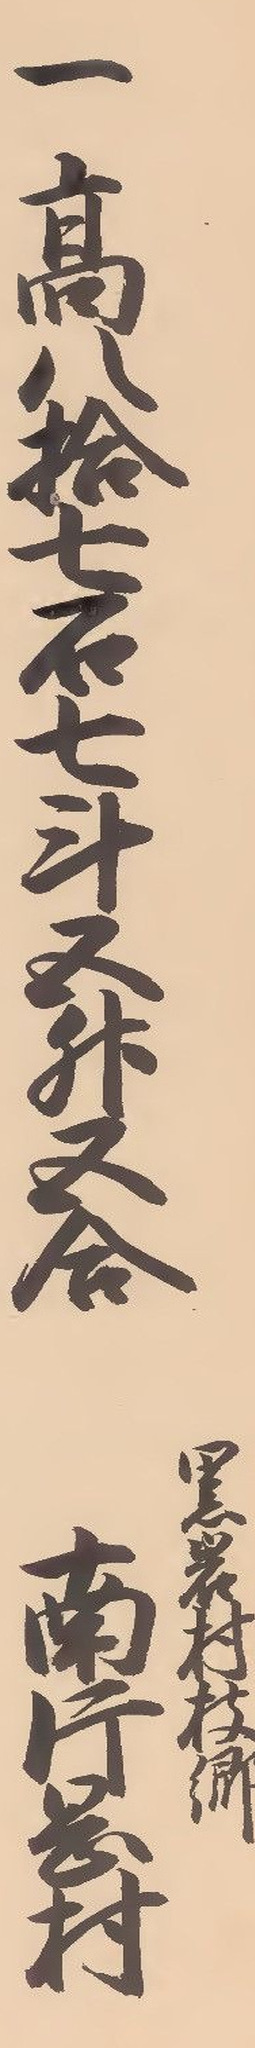一髙八拾七石七斗五升五合南片岡村
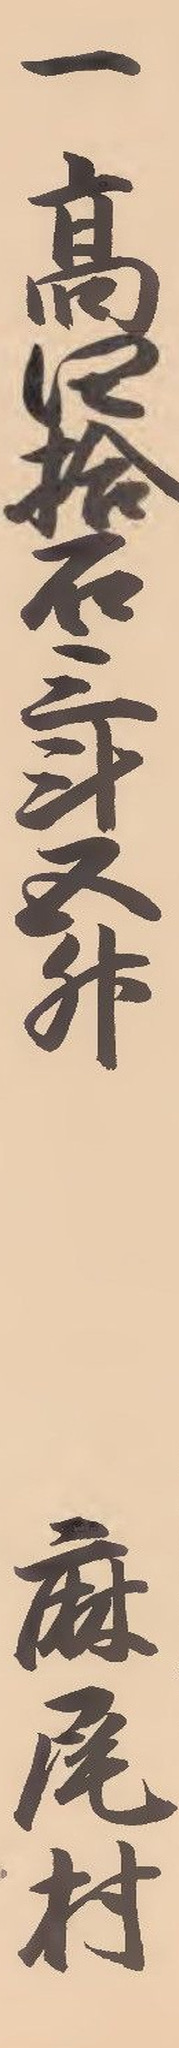一髙四拾三斗五升麻尾村
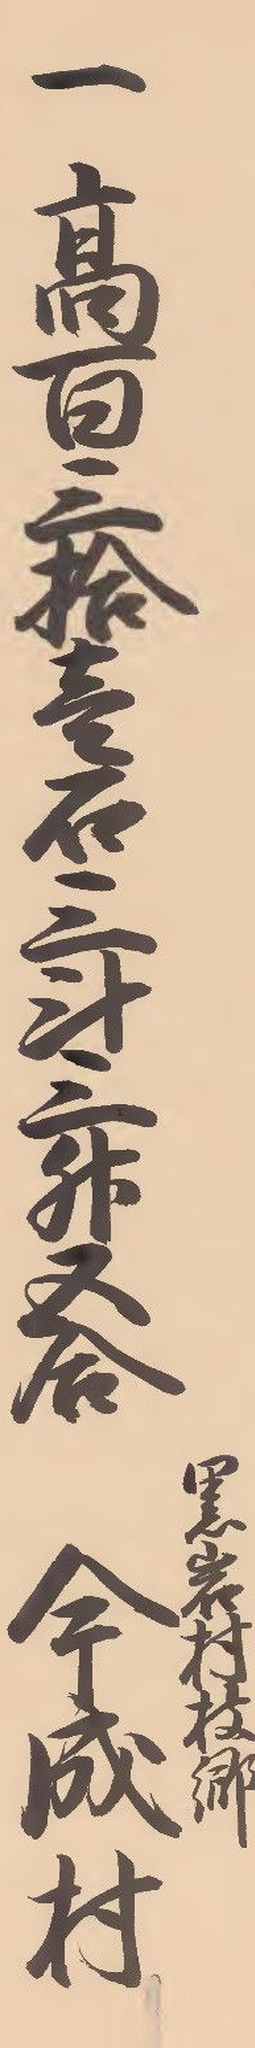一髙百三拾壱石三斗三升五合今成村
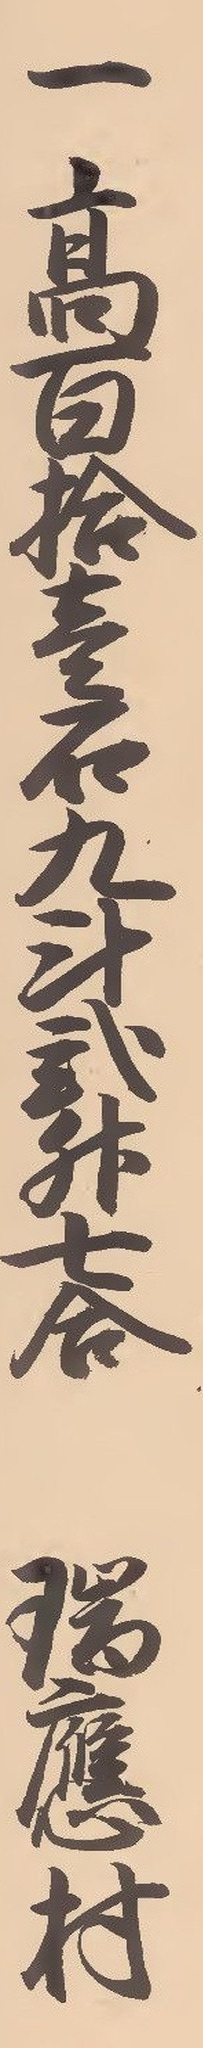一髙百拾壱石九斗弐升七合応村
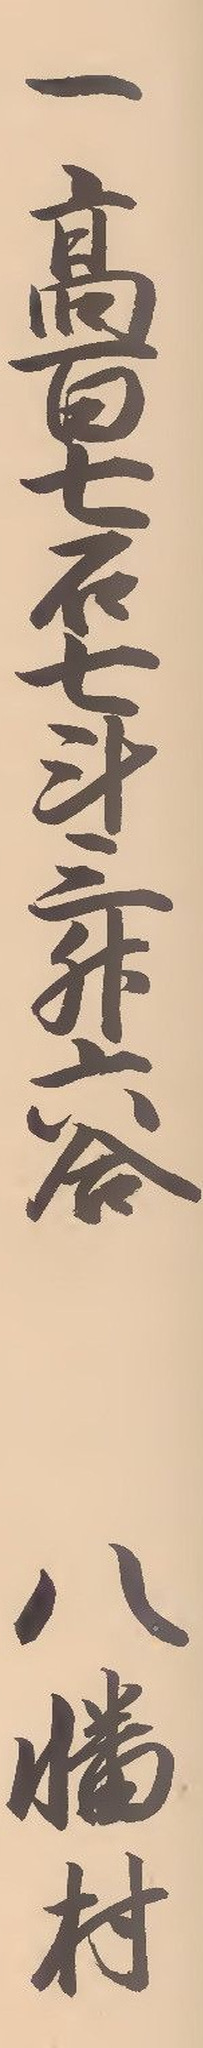一髙百七石七斗三升六合八幡村
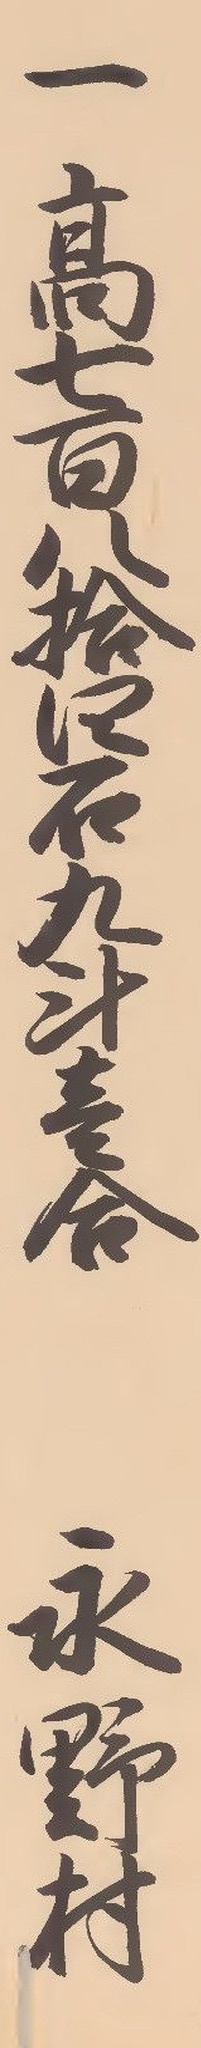一髙七百八拾四石九斗壱合永野村
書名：土佐国郷帳
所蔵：国立公文書館 National Archives of Japan
